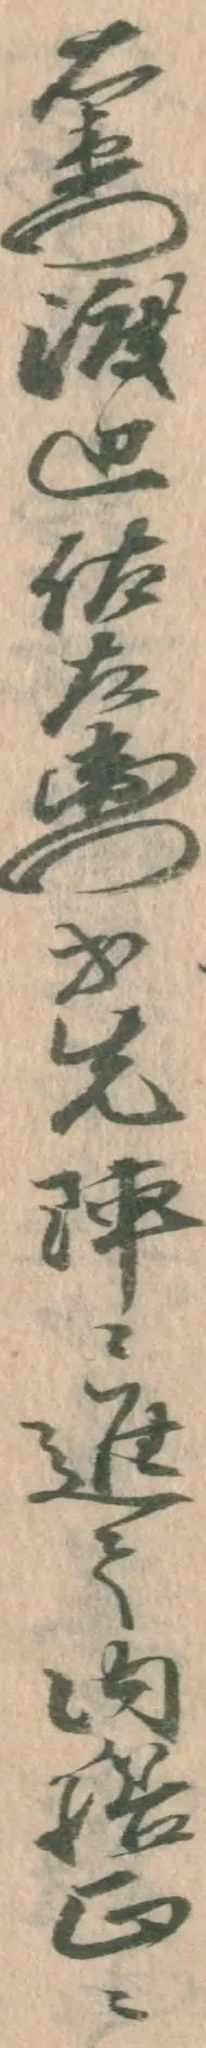右衛門渡辺佐左衛門等先陣に進て内膳正に
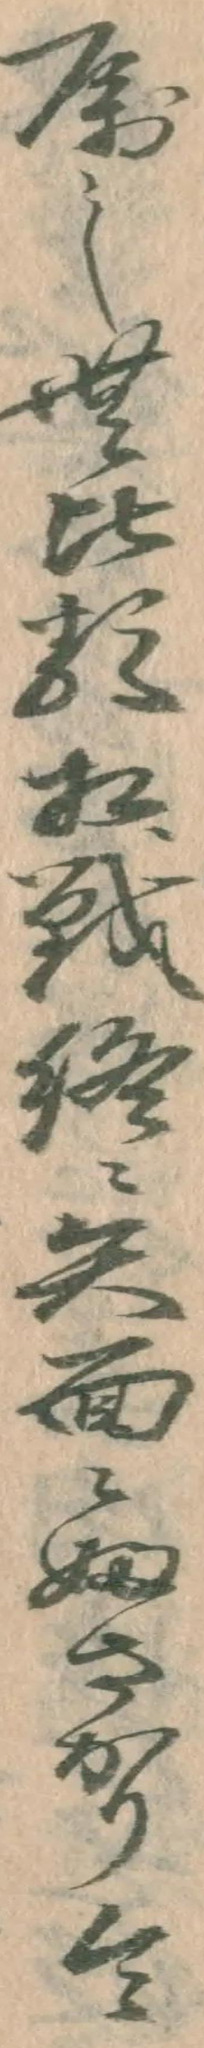属し無比類相戦終に矢面に婦さかり令
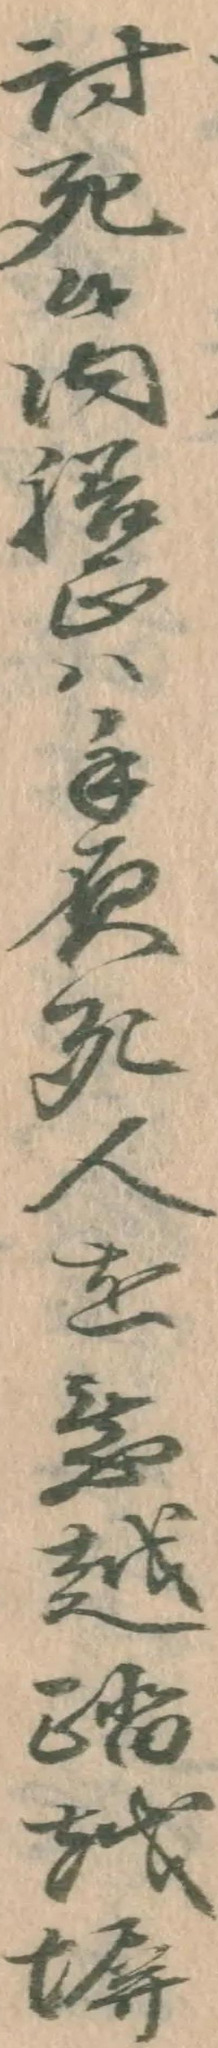討死候内膳正は手負死人を乗越踏越塀
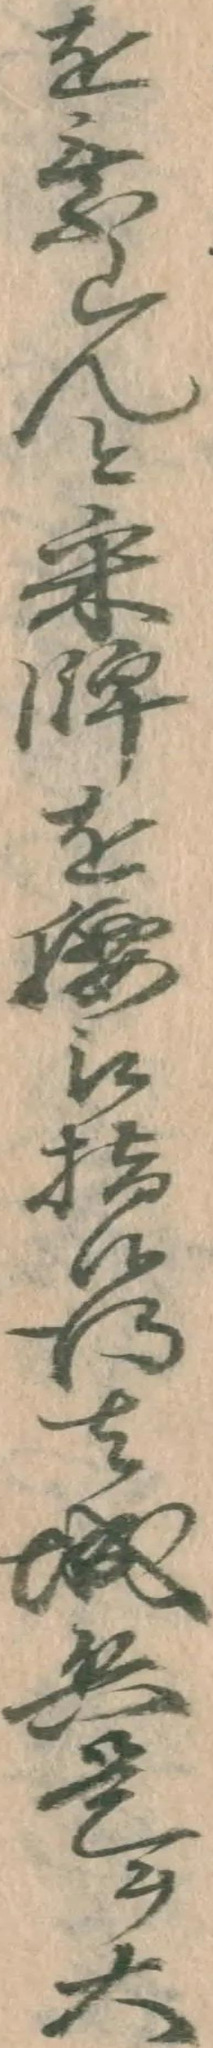を乗己んと采牌を腰江指候得者城兵是を大
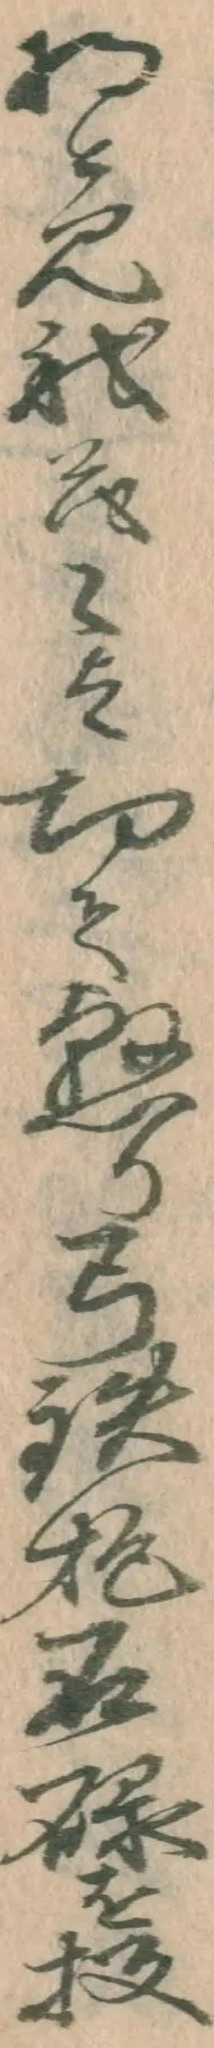将と見我茂々与切て懸り弓鉄炮石礫を投
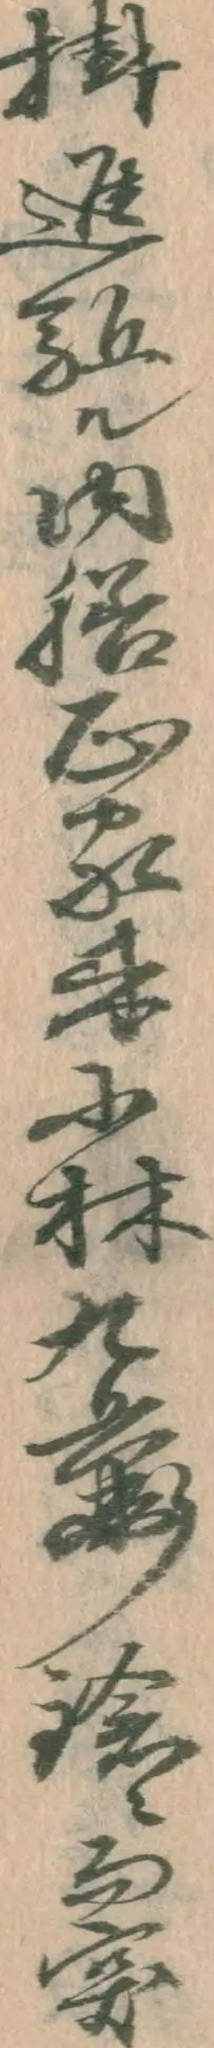掛進駈る内膳正家来小林九兵衛鎗に而突
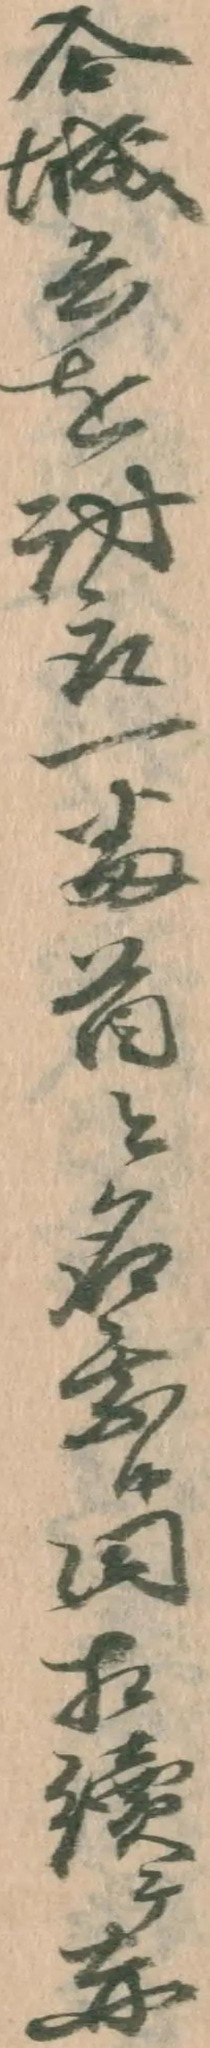合城兵を討取一番首と名乗候因相続て赤
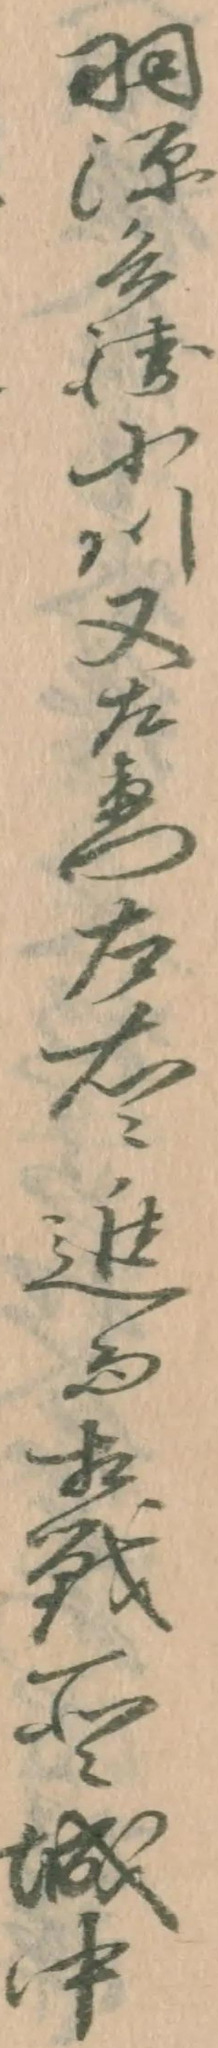羽源兵衛小川又左衛門左右に進而相戦所に城中
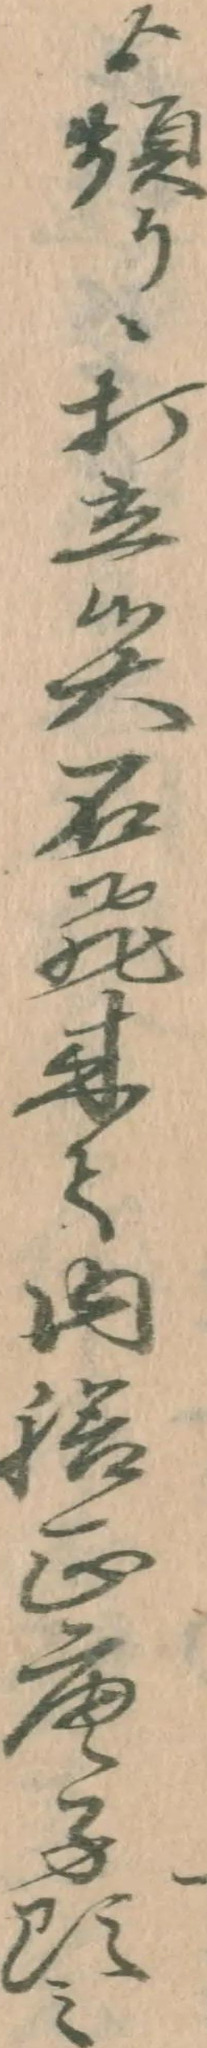ゟ頻りに打立候大石飛来て内膳正唐子頭之
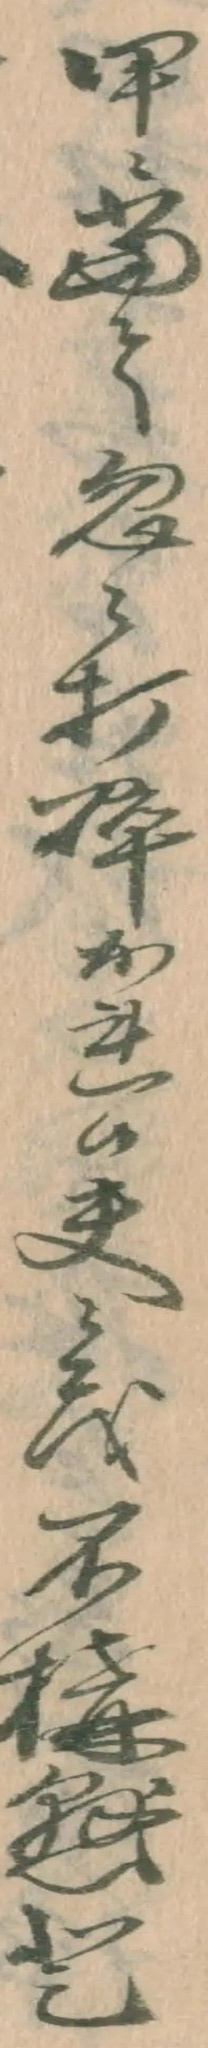甲に当て忽に打砕か連候夫に茂不構懸登
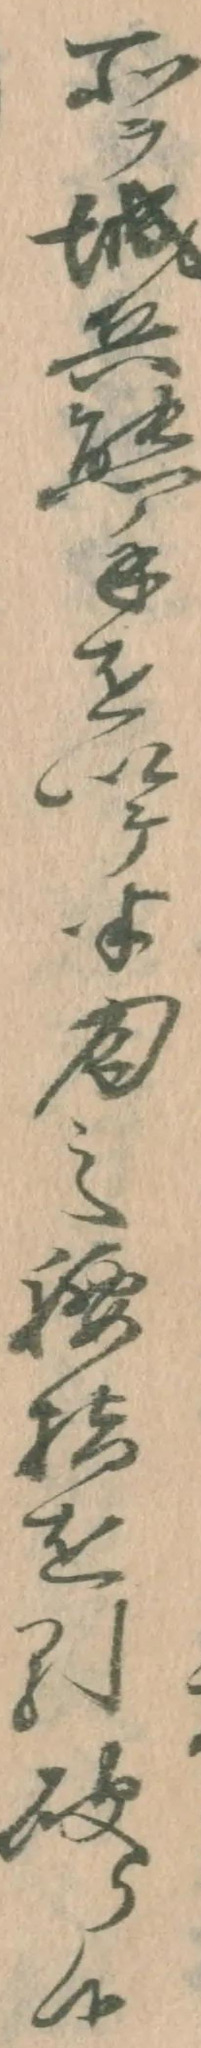所を城兵熊手を以て半月之腰指を引破り候
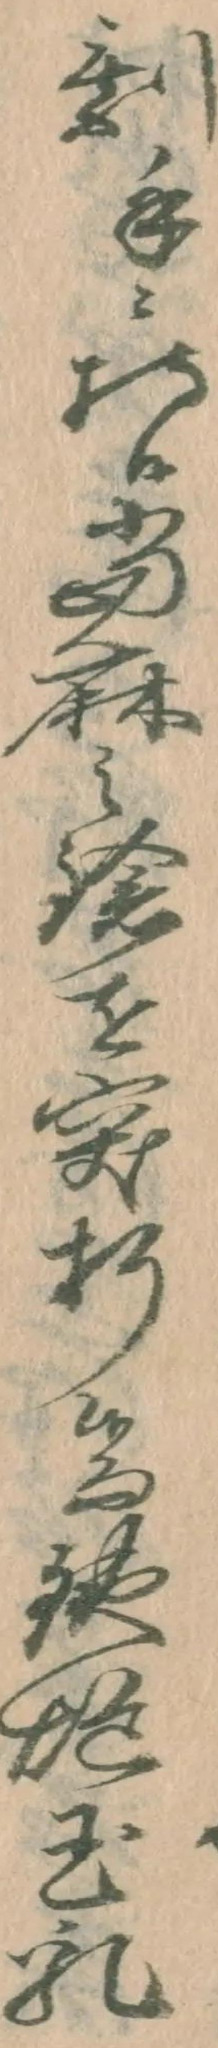剰手に持候当麻之鎗を突折候而鉄炮玉乳
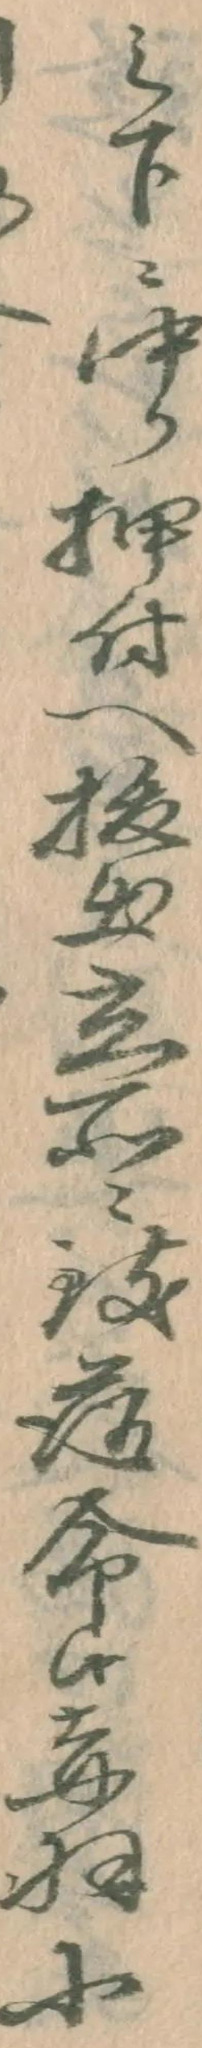之下に中り押付へ抜出立所に致落命候赤羽小
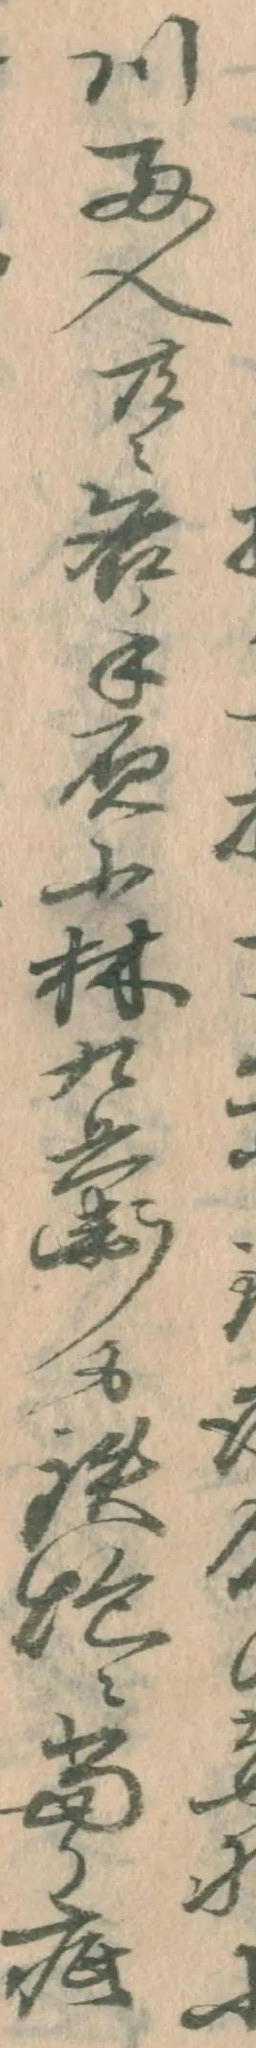川両人共に各手負小林九兵衛も鉄炮に当り疵
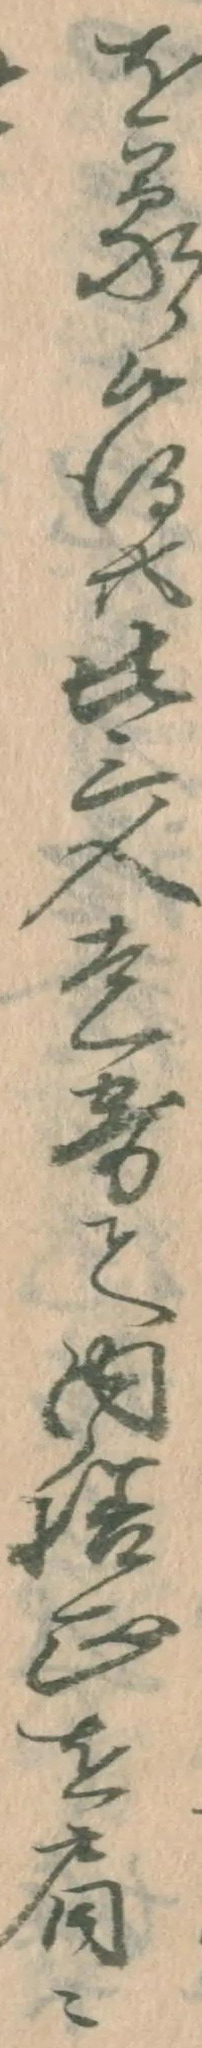を承り候得共此三人走寄て内膳正を肩に
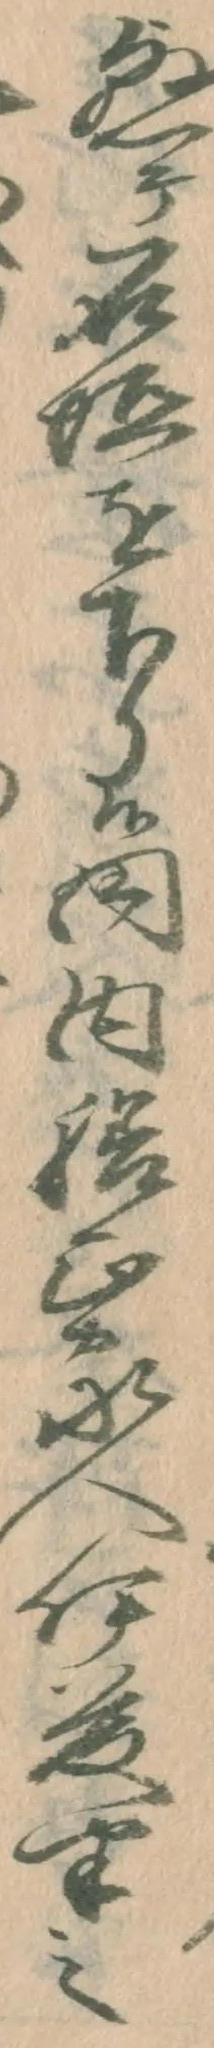懸て石垣を下り候内内膳正家人伊藤半之
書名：切支丹御退治記 49巻. [5]
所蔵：国立国会図書館 National Diet Library, JAPAN
